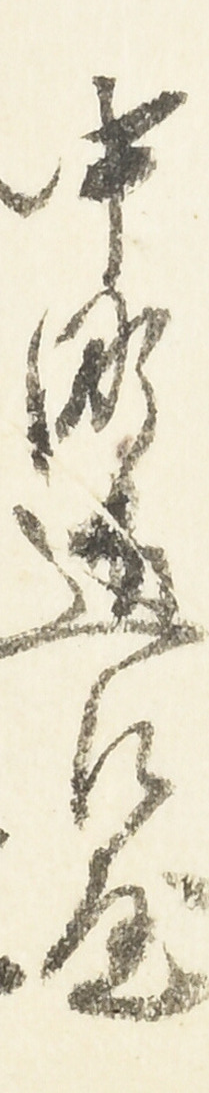中町近江屋
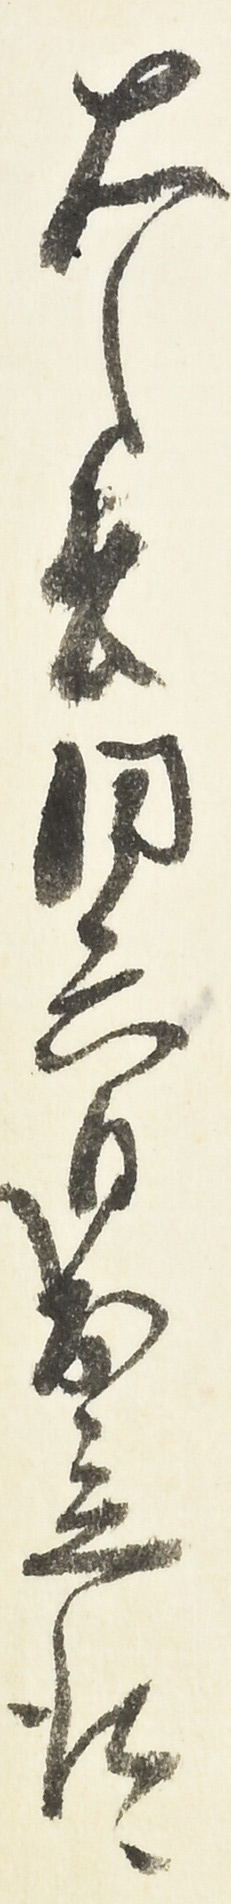右之者同六日出立仕候
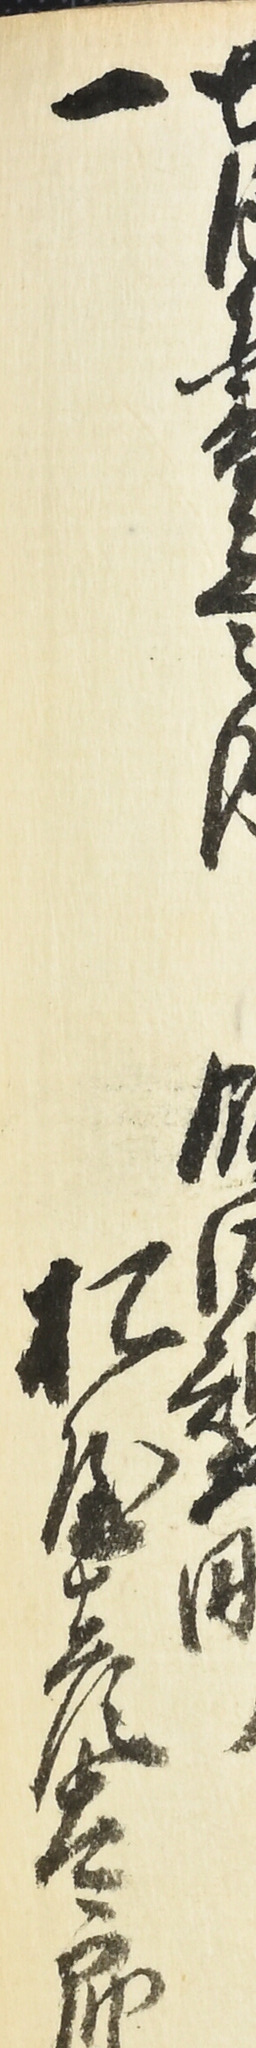一松屋彦太郎
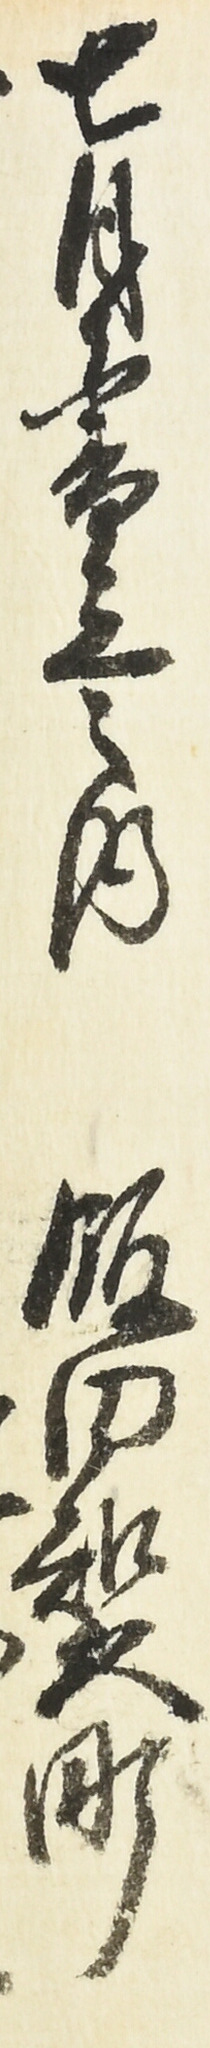七月書上之内飯田知久町

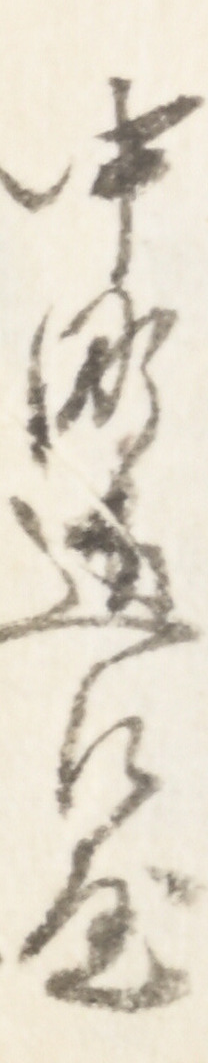中町近江屋
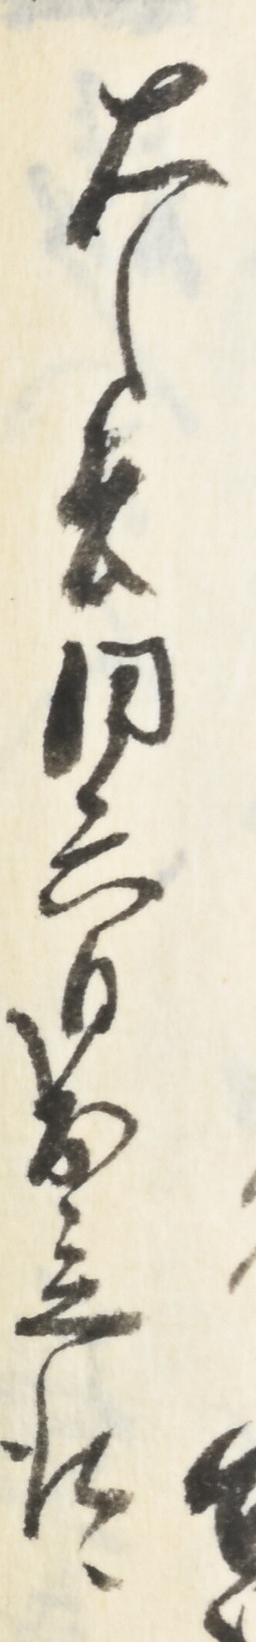右之者同十四日出立仕候
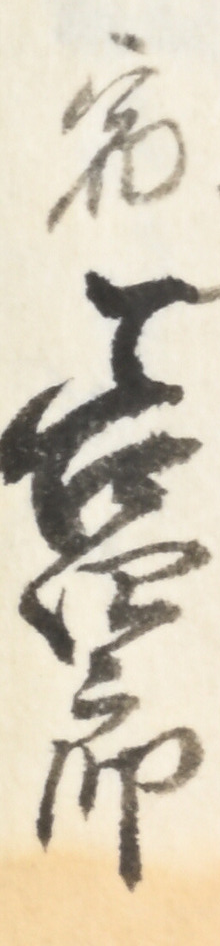宿善四郎
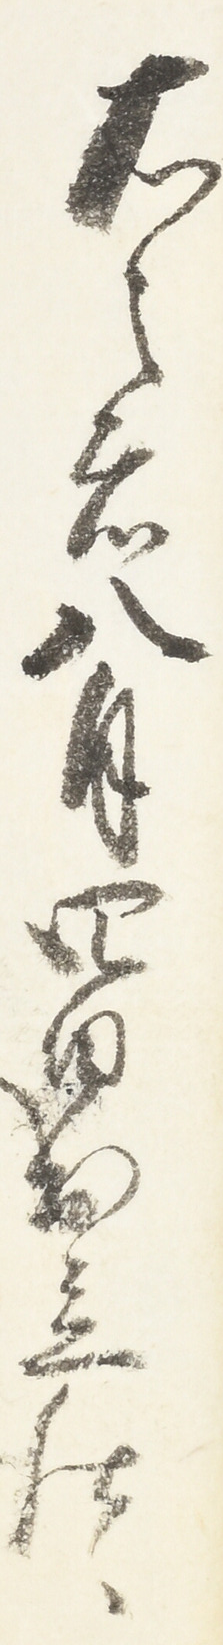右之者八月四日出立仕候
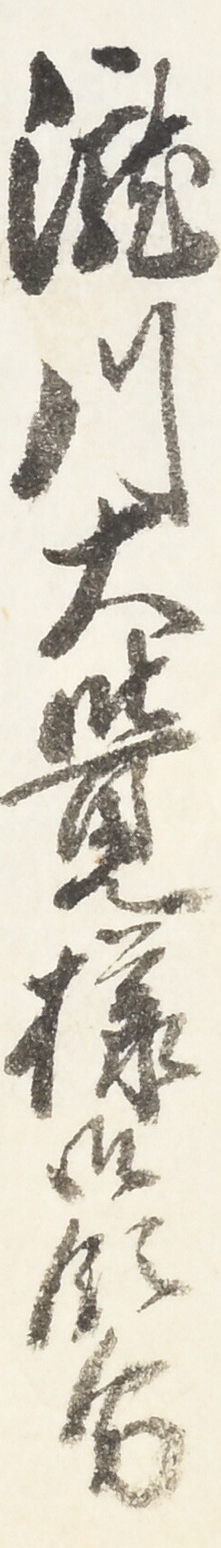瀧川大覚様御領分
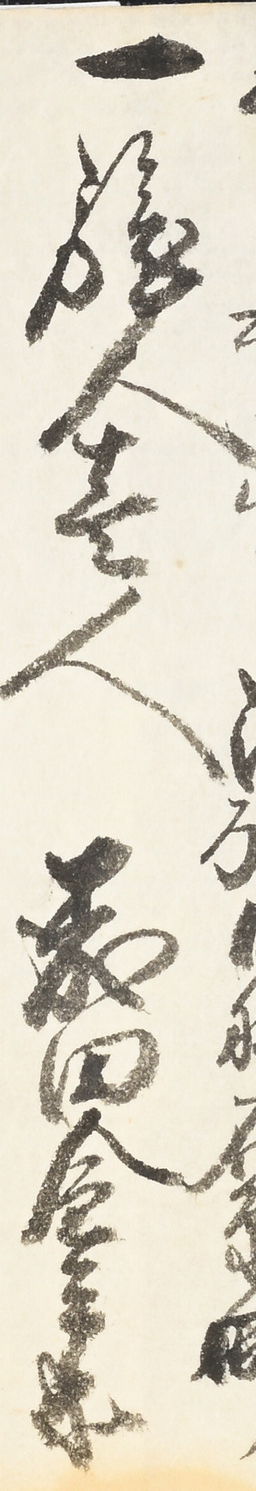一旅人壱人森田金兵衛
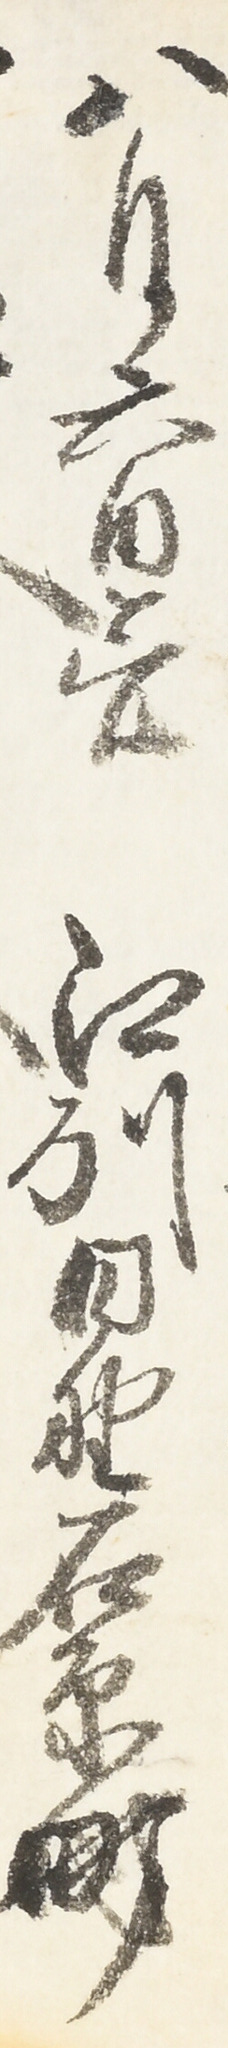八月六日着江州日野石原町
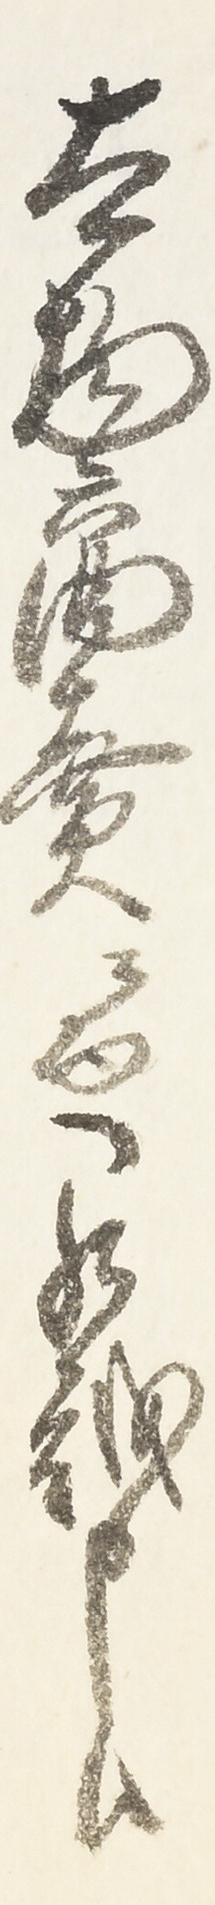太物商売ニ而罷越申候
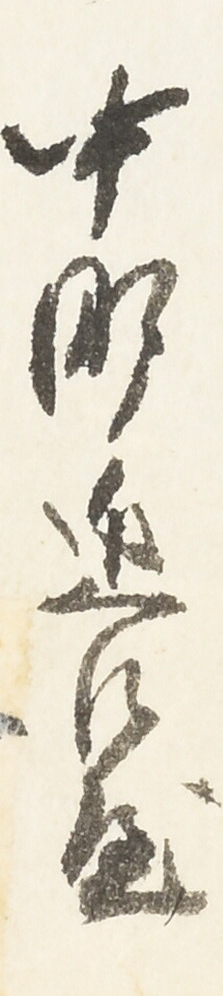中町近江屋
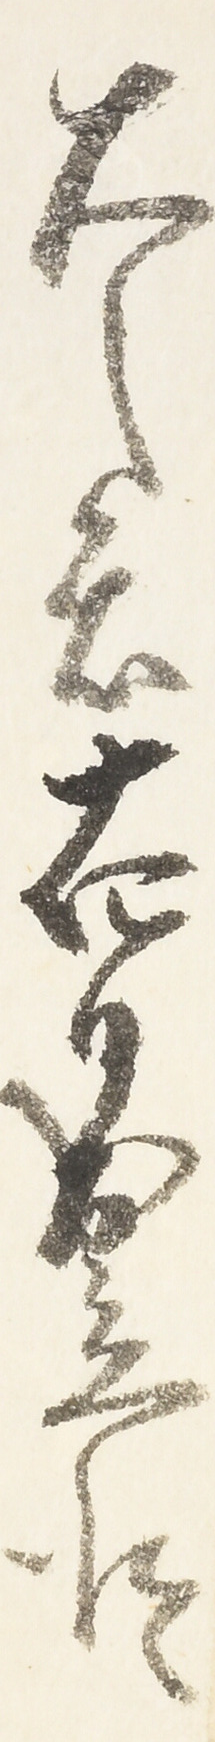右之者十四日出立仕候
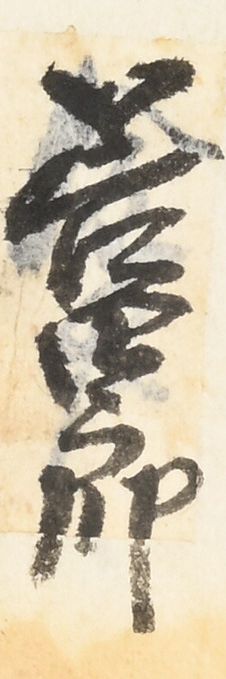善四郎
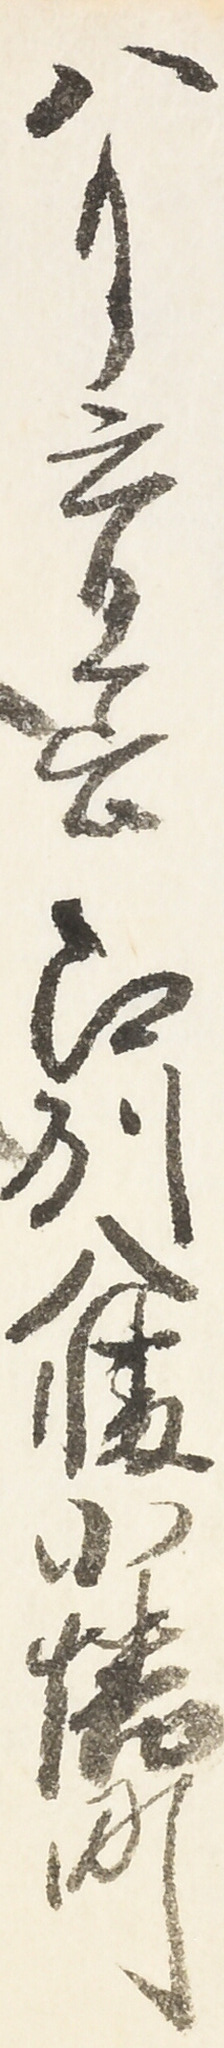八月六日着江州八幡小幡町
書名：町中旅人泊控帳
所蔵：伊那市立高遠町図書館・合同会社AMANE
